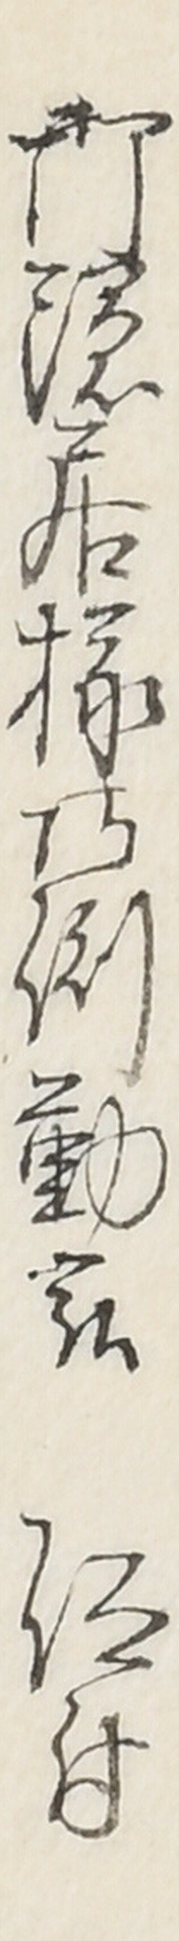御隠居様御側勤被仰付
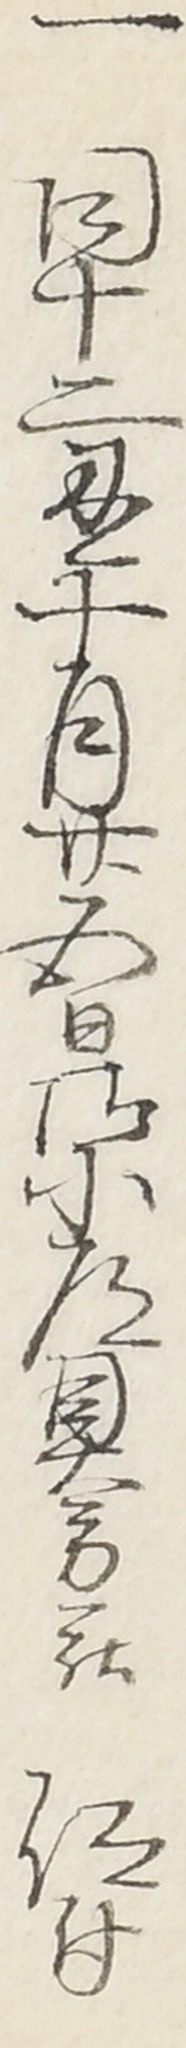一同十二丑十月廿五日御小道具方被仰付
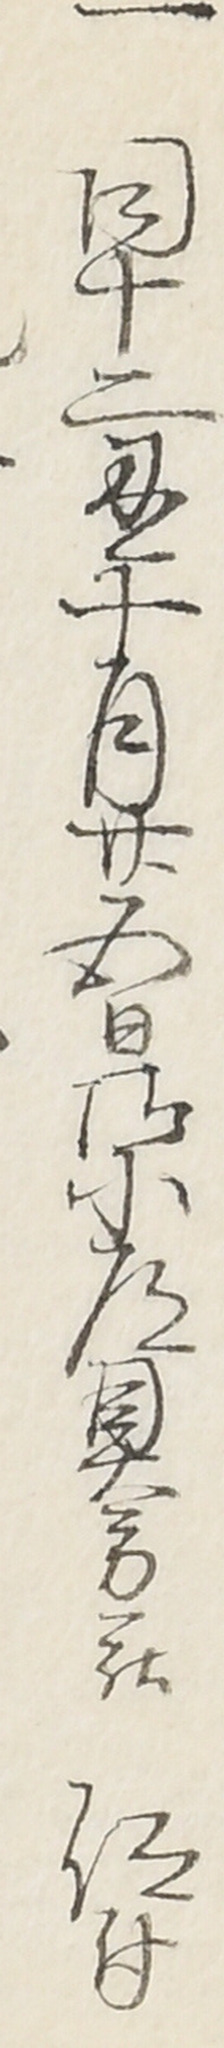一同十二丑十月廿五日御小道具方被仰付
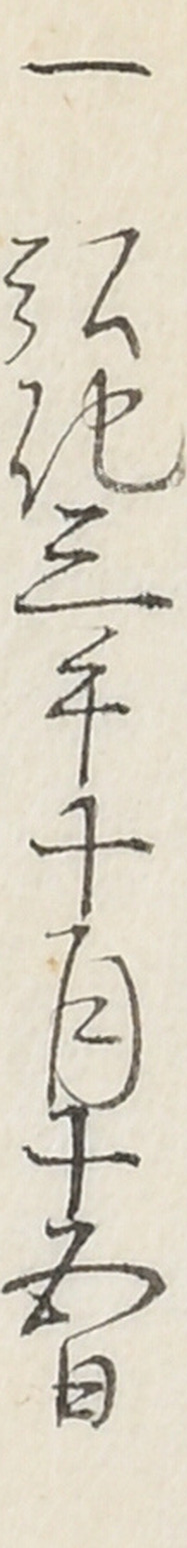一弘化三午十月十五日
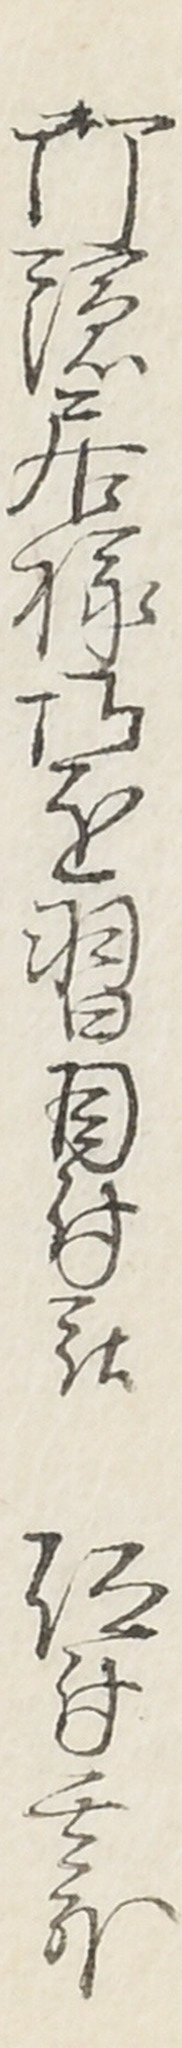御隠居様御近習目付被仰付其外
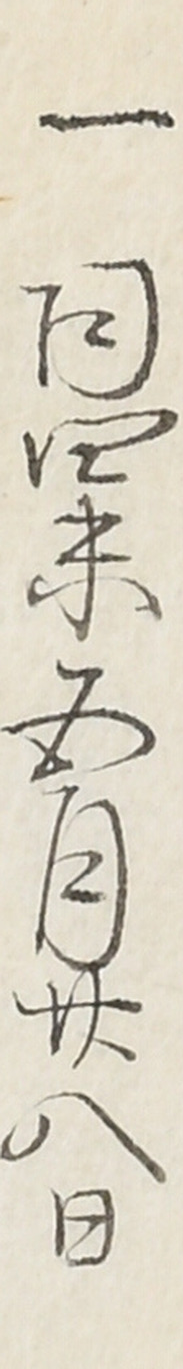一同四未五月廿八日
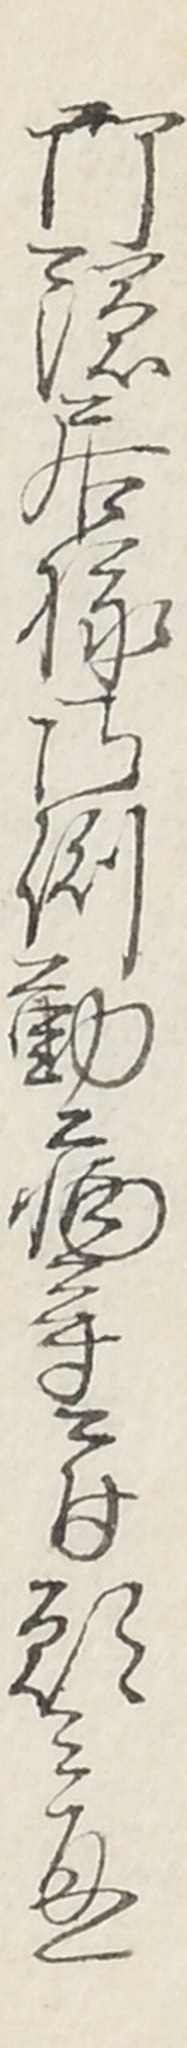御隠居様御側勤病気ニ付願之通
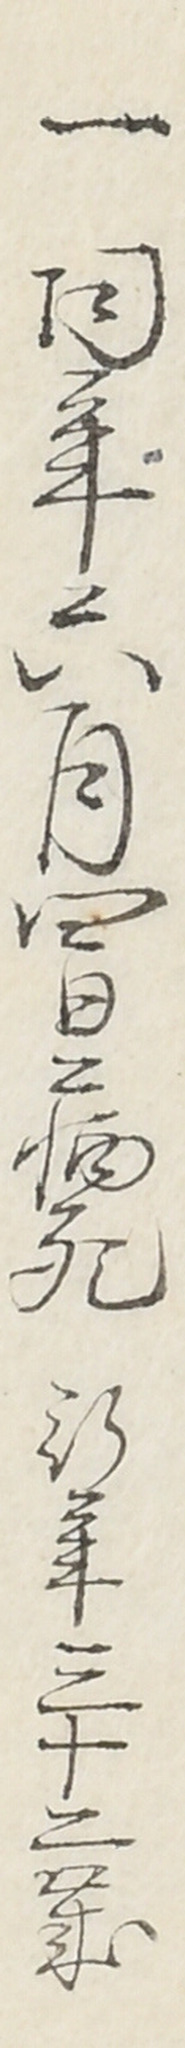一同年六月四日病死行年三十二歳

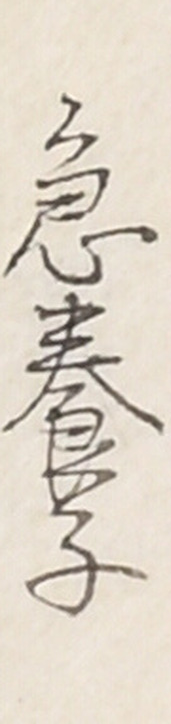急養子
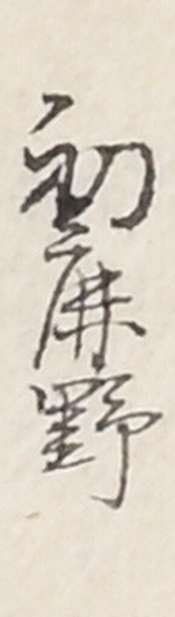初鹿野
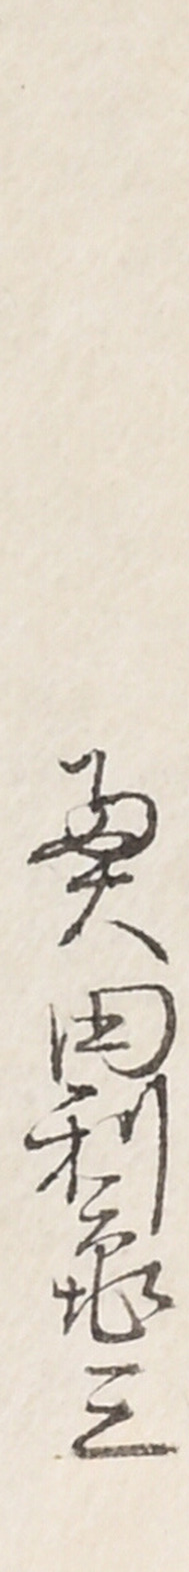奥田利亀三
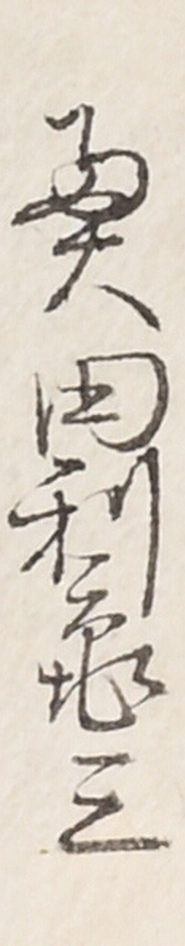奥田利亀三
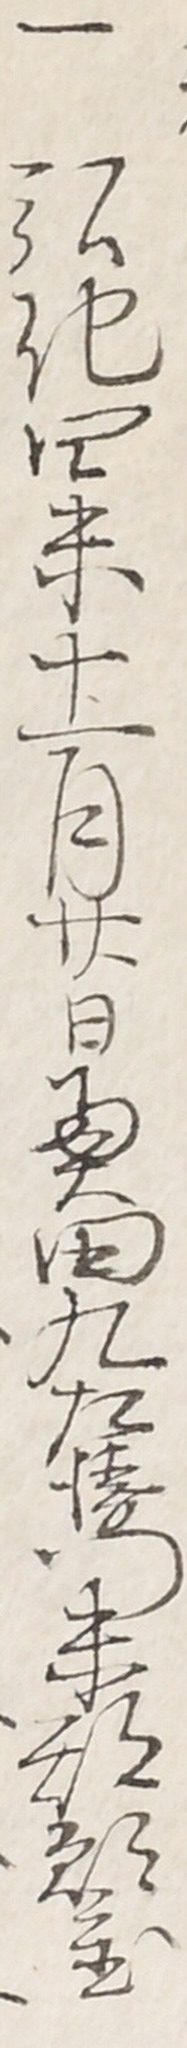一弘化四未十一月廿日奥田九左衛門末期願置
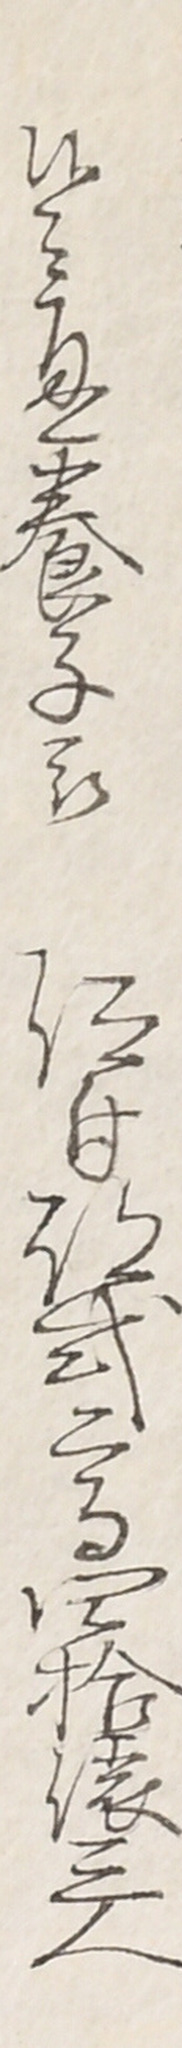候之通養子被仰付跡式高四拾俵三人
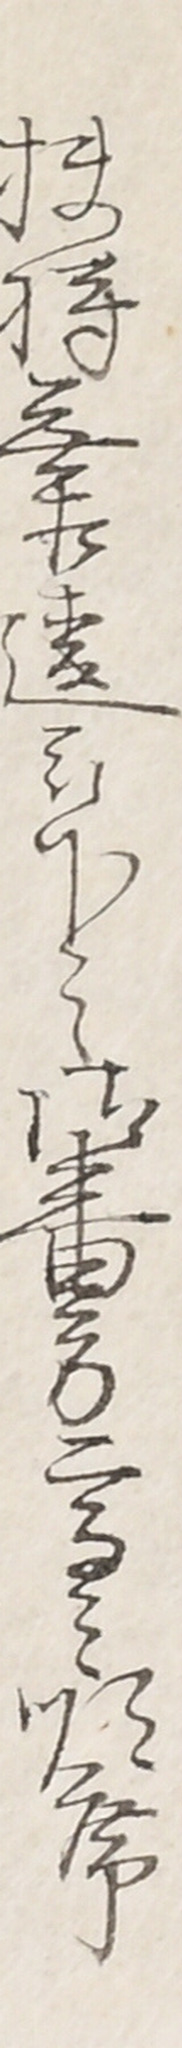扶持無相違被下之御番方高之順席
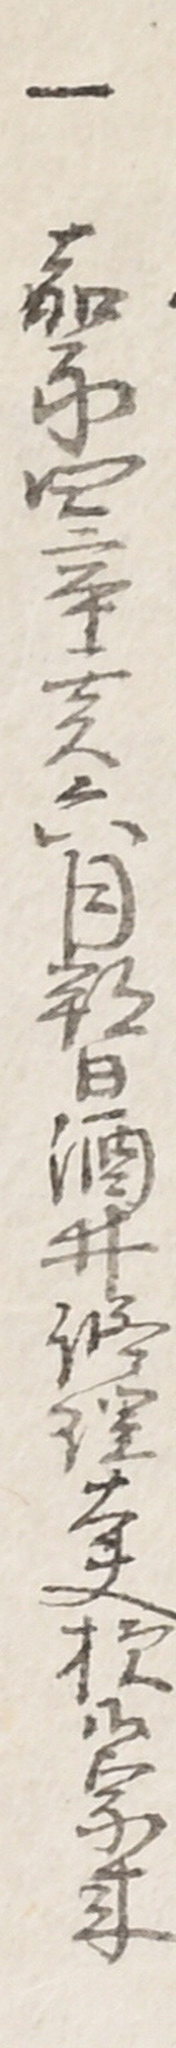一嘉永四辛亥六月朔日酒井修理大夫様御家来
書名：給人諸士勤仕録（七）
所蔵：伊那市立高遠町図書館・合同会社AMANE
